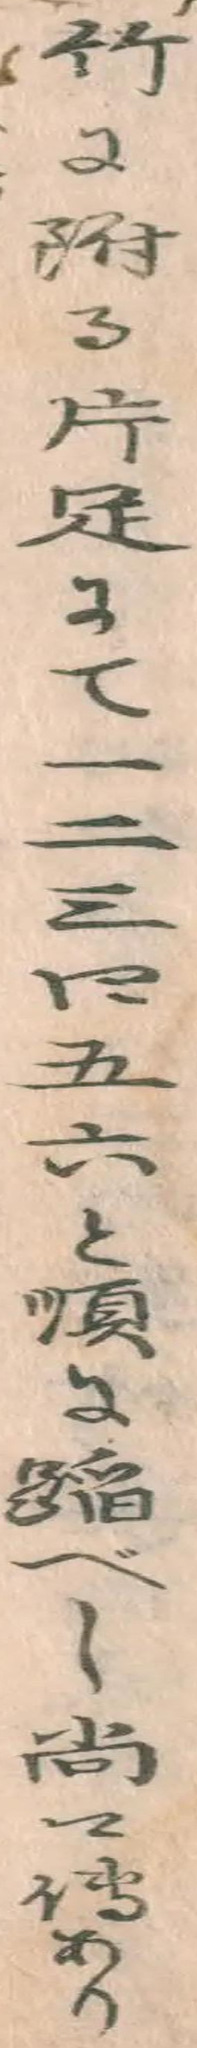竹に附る片足にて一二三四五六と順に蹈べし尚口伝あり
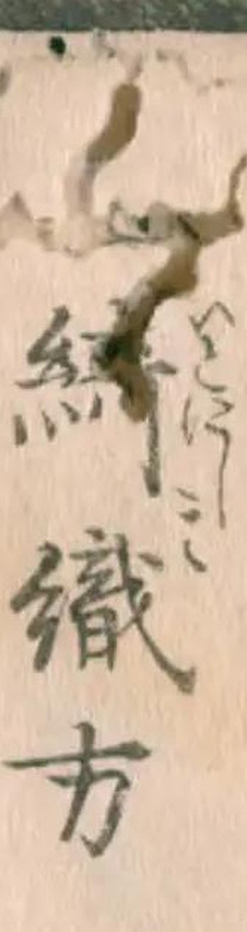綺織方
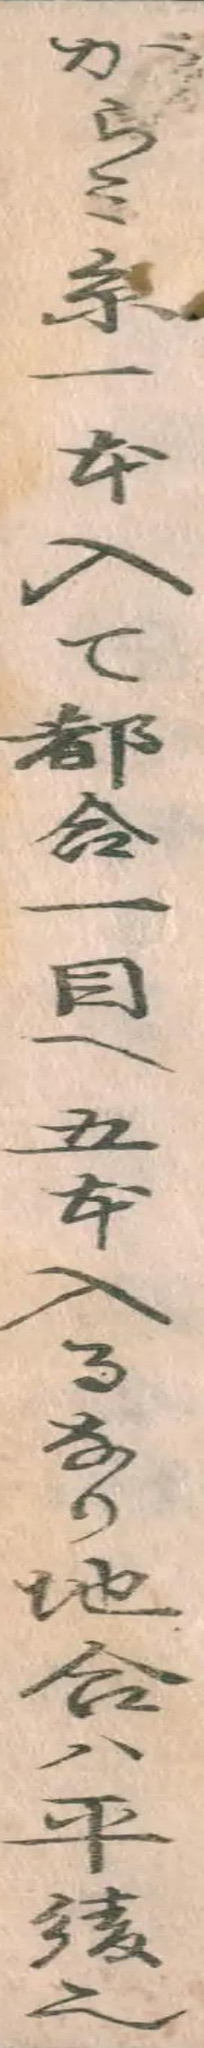からみ糸一本入て都合一目へ五本入るなり地合は平綾也
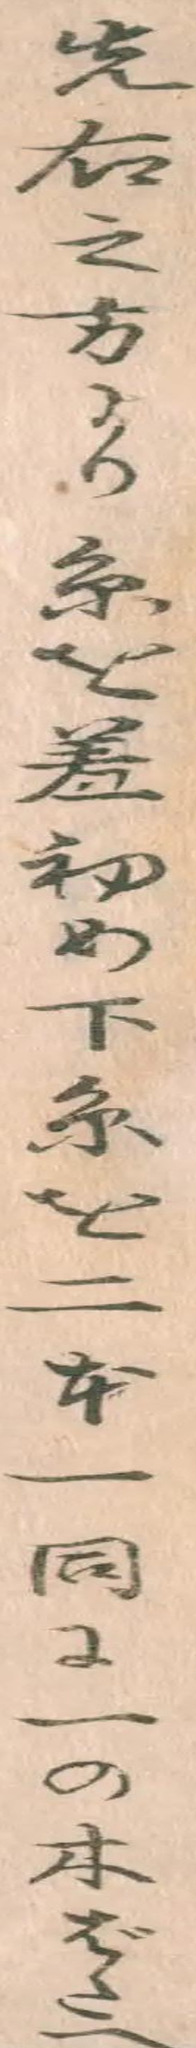先右之方より糸を差初め下糸を二本一同に一の木ばたへ
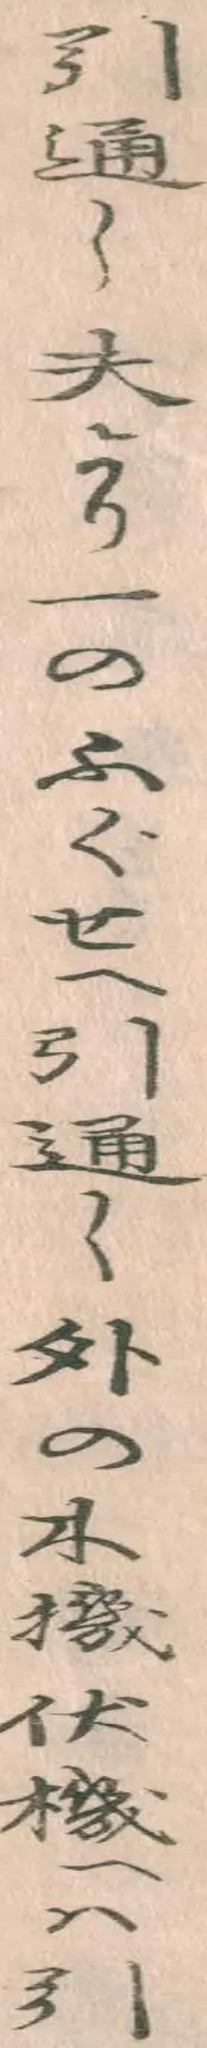引通し夫より一のふぐせへ引通し外の木機伏機へは引
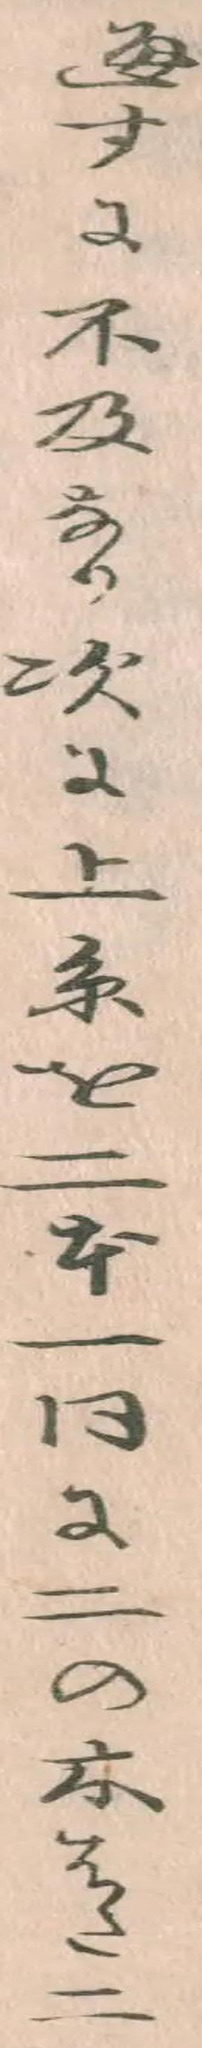通すに不及なり次に上糸を二本一同に二の木はた二
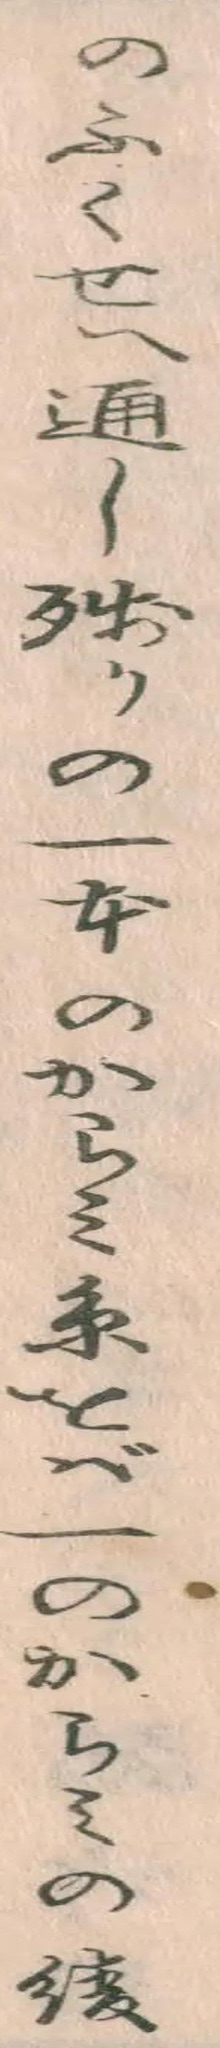のふくせへ通し残りの一本のからみ糸をば一のからみの綾
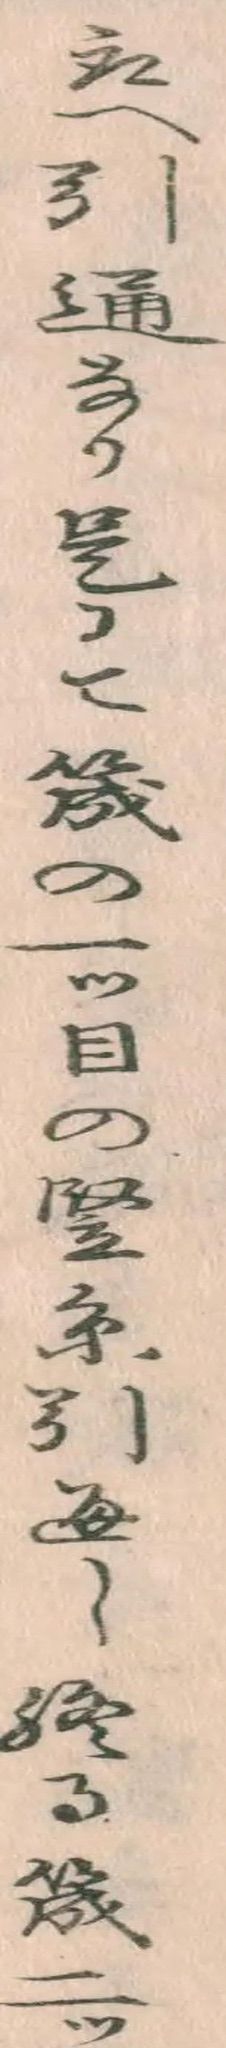取へ引通なり是にて筬の一ッ目の竪糸引通し終る筬二ッ
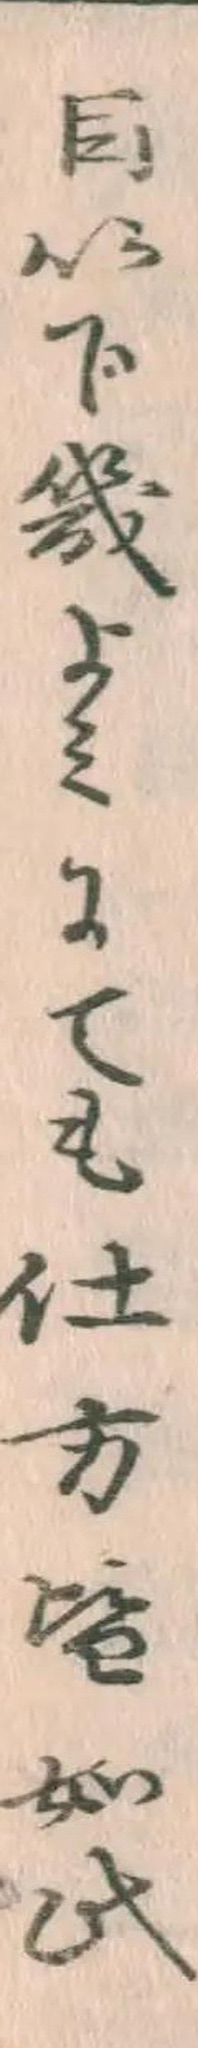目以下幾よみにても仕方皆如此
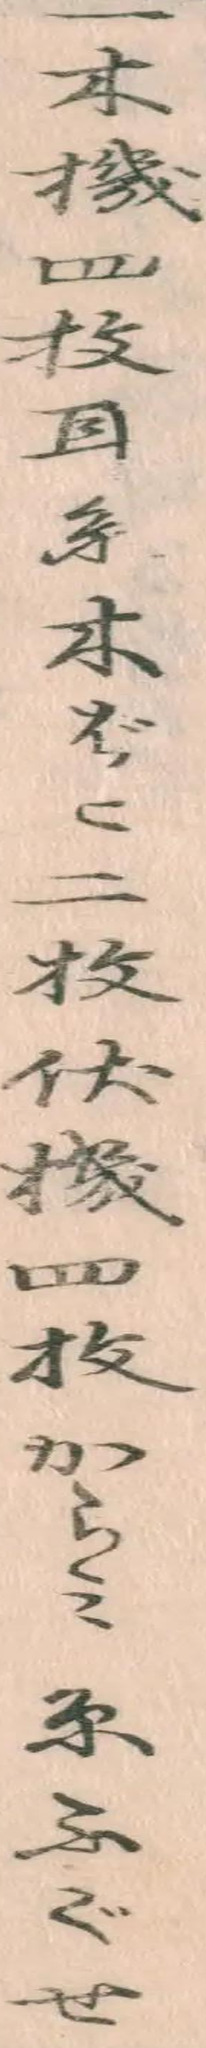一木機四枚耳糸木ばた二枚伏機四枚からみ糸ふぐせ
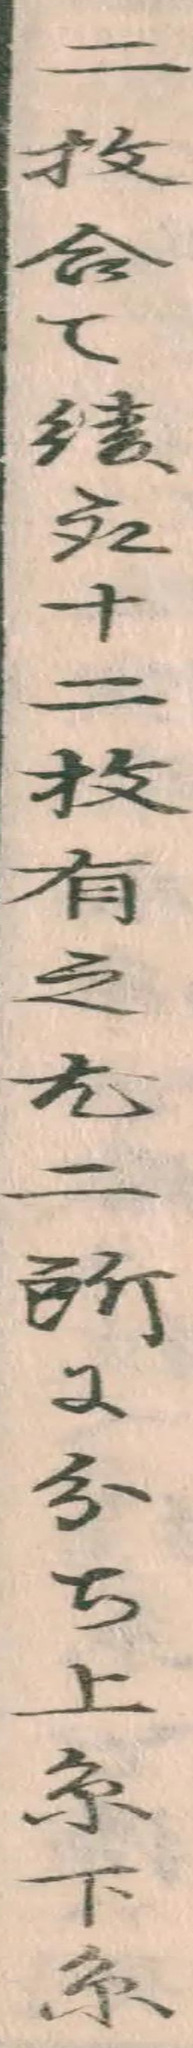二枚合て綾取十二枚有之尤二所に分ち上糸下糸
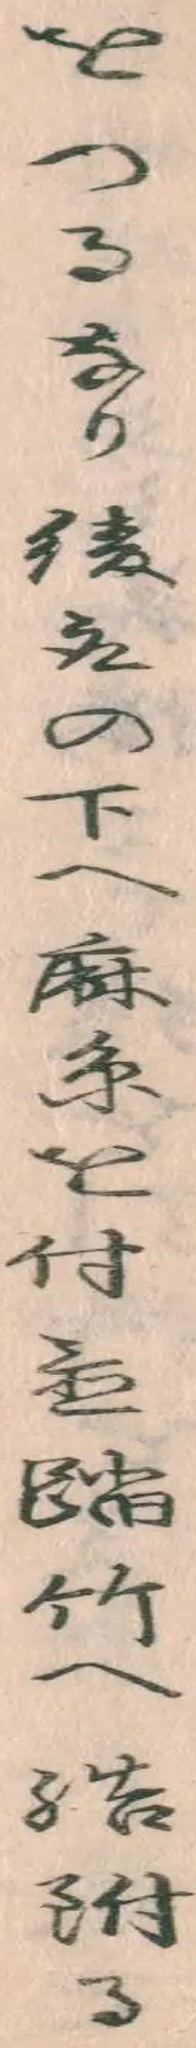をつるなり綾取の下へ麻糸を付置蹈竹へ結附る
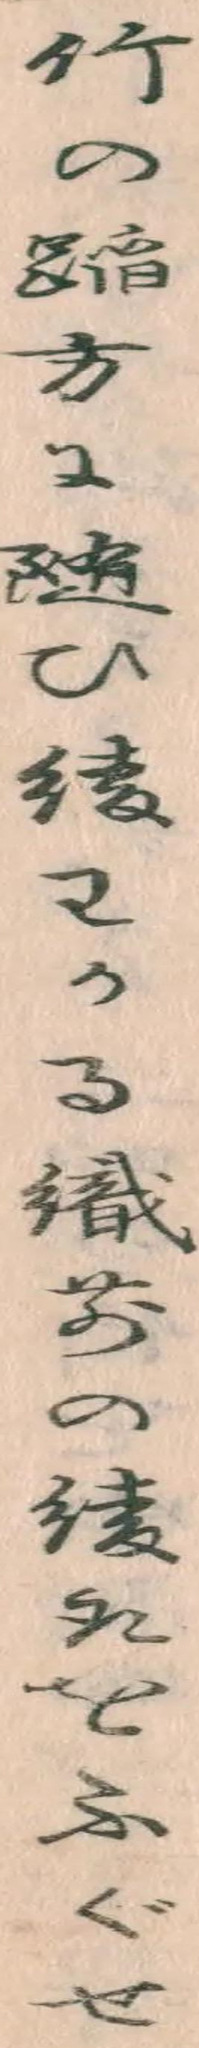竹の蹈方に随ひ綾わかる織前の綾取をふぐせ
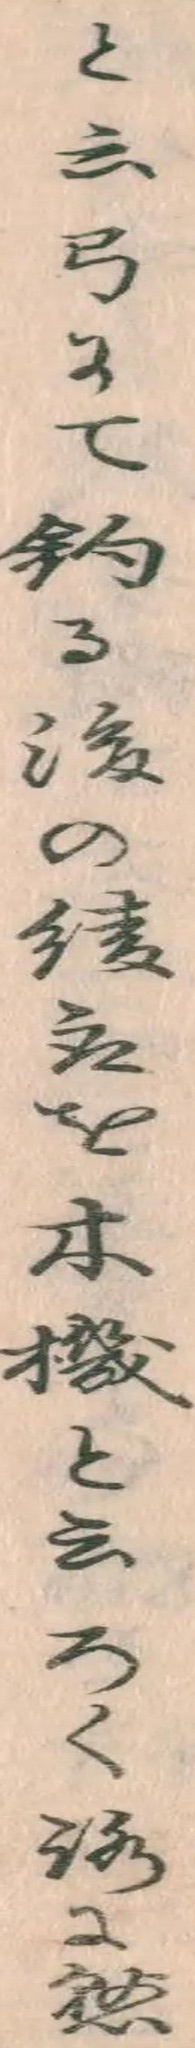と云弓にて釣る後の綾取を木機と云ろくろに懸
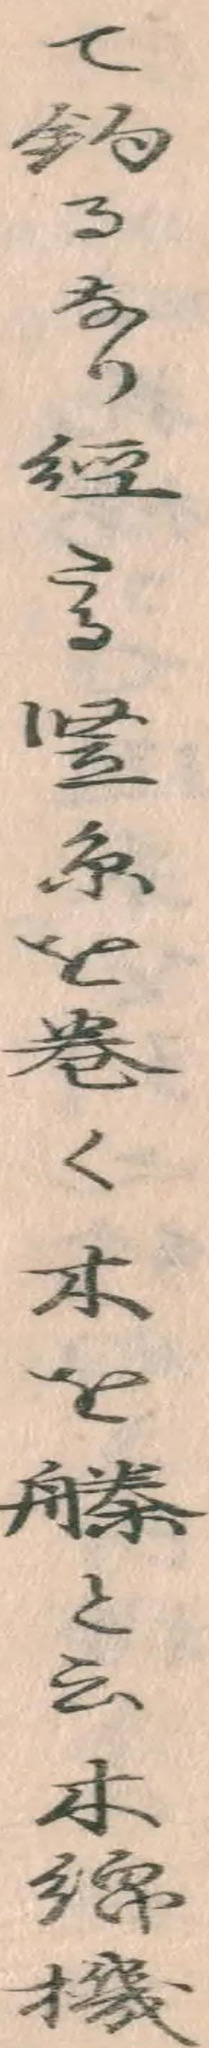て釣るなり経たる竪糸を巻く木を𣚗と云木綿機
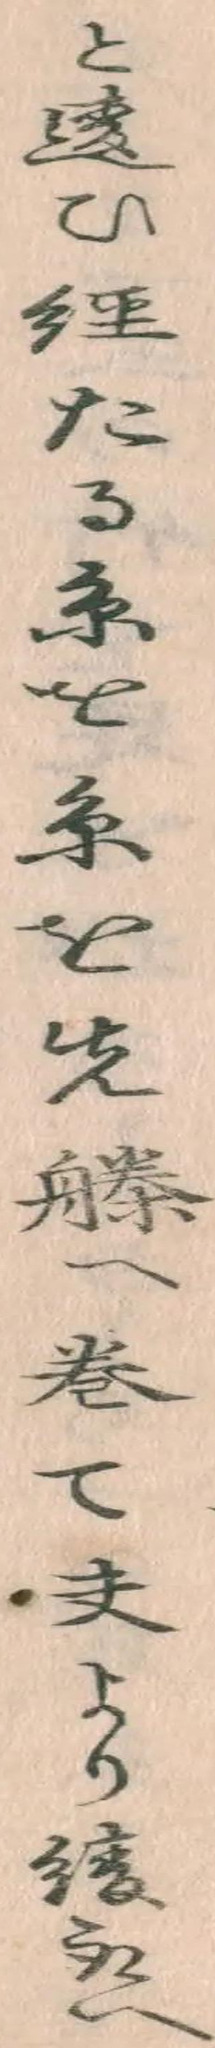と違ひ経たる糸を糸を先𣚗へ巻て夫より綾取へ
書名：機織彙編 5巻. [2]
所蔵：国立国会図書館 National Diet Library, JAPAN
